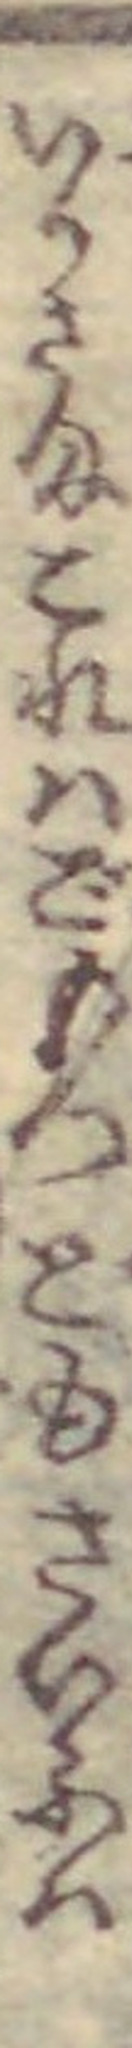いかさまこれはごもつともさいふは
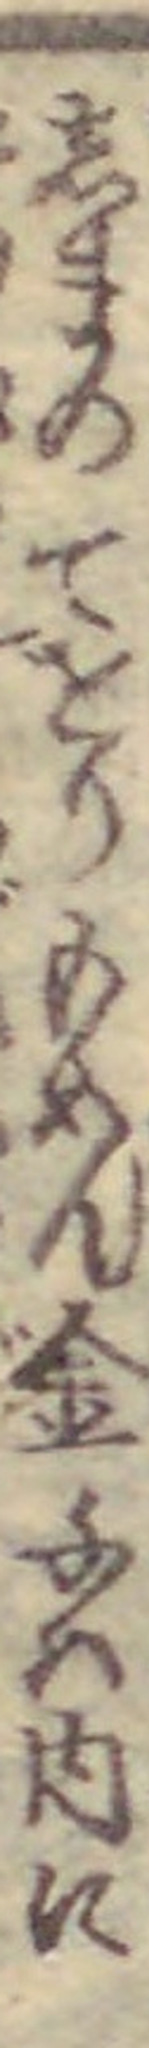しまのてをりもめん金子は内に
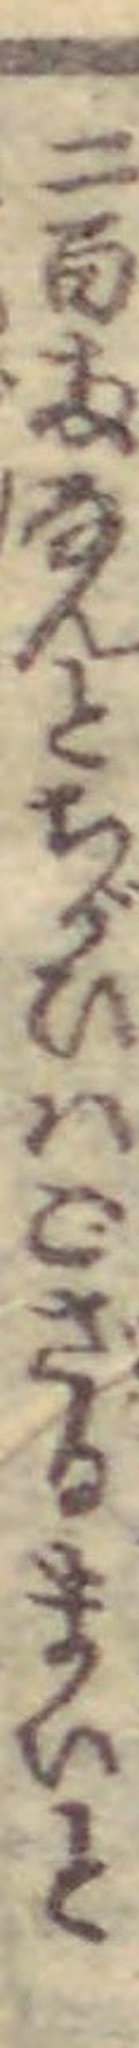二百両なんとちがひはござるまいと
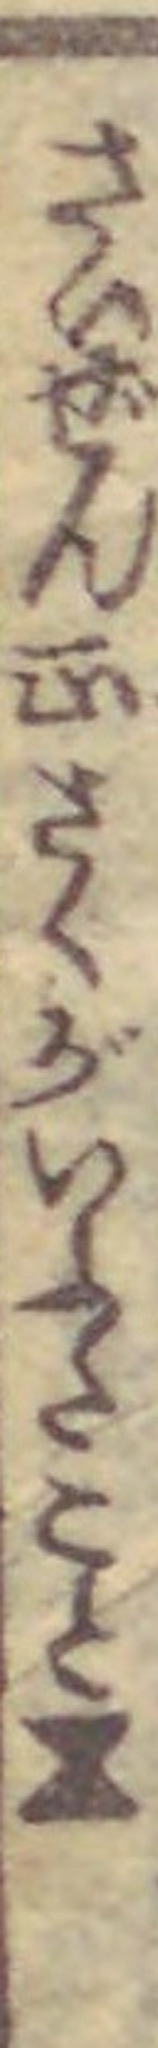さいぜん正さくがいふこと▼▲

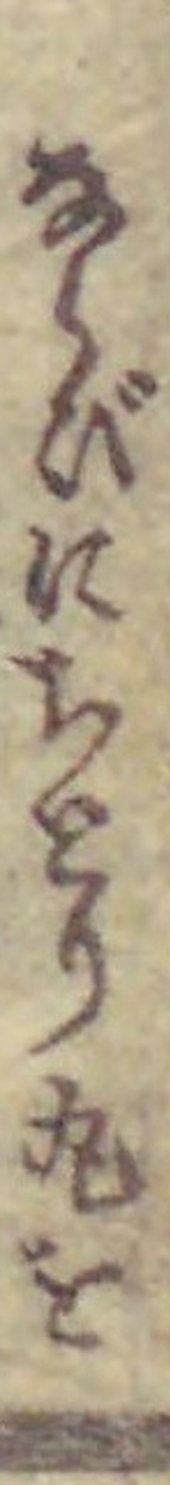ならびにちとり丸を
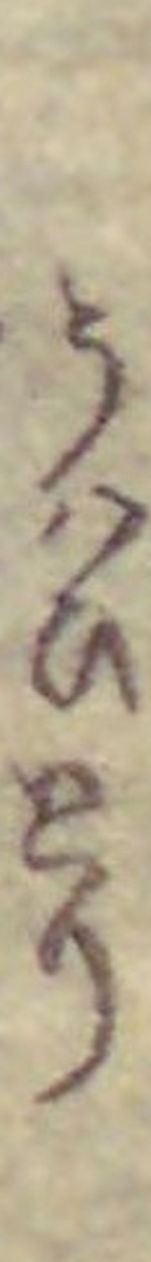うはいとり
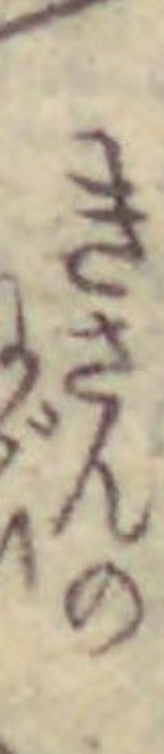きさんの
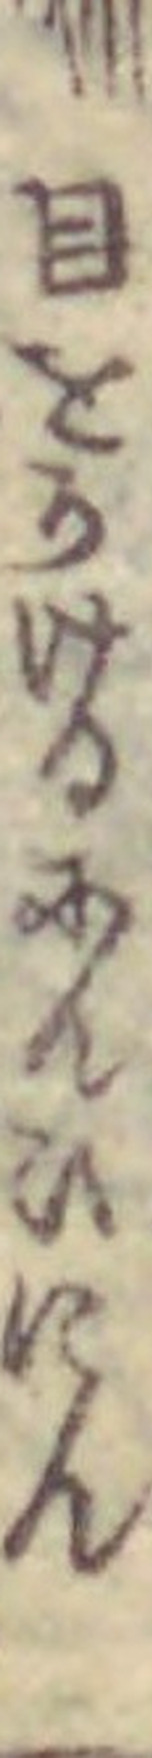目をかけるにんひにん
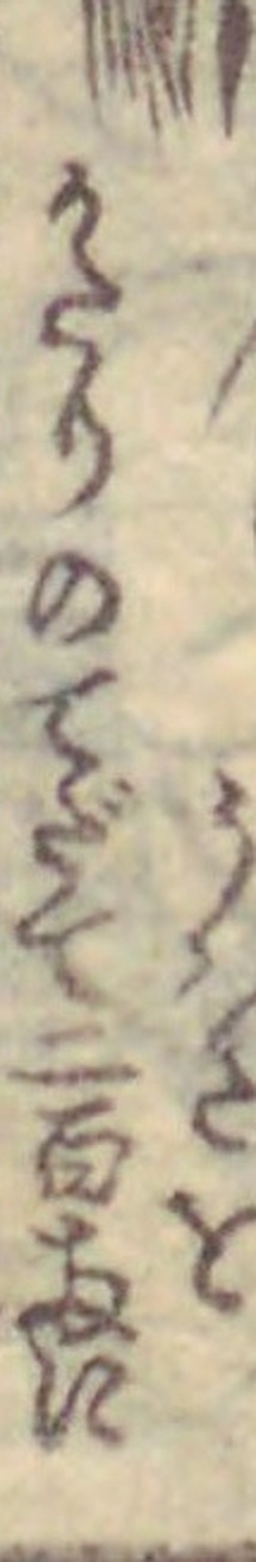かたりのてだて二百両に
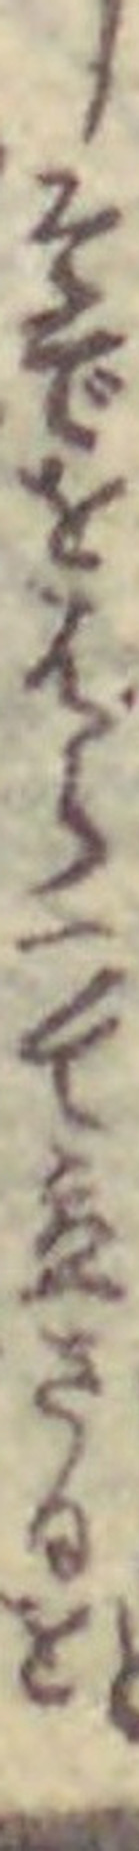そでをはらつて立さるを
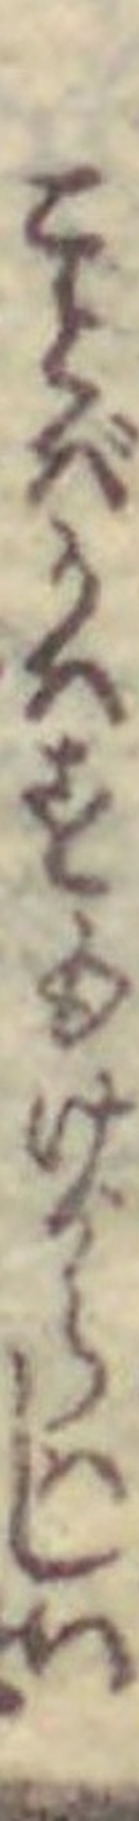ことばかはすもけがらはしいと
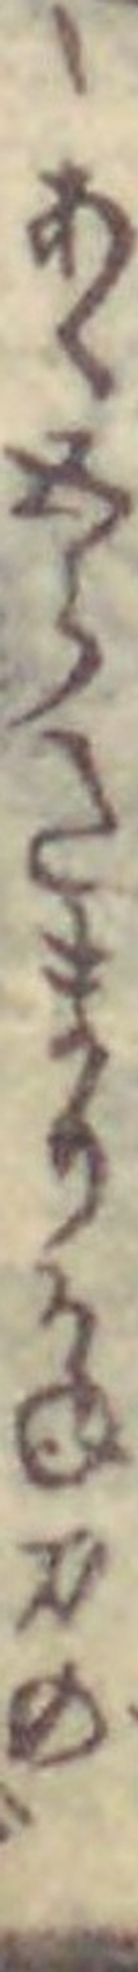あく五郎たまりかね刀の
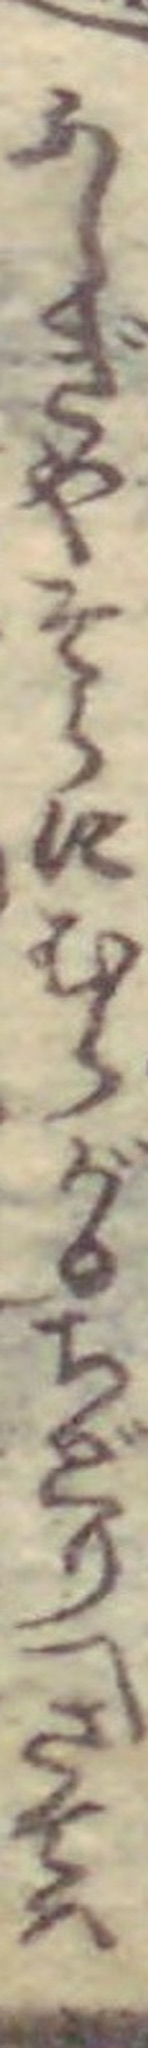ふしぎやそらにむらがるちどり〽さては
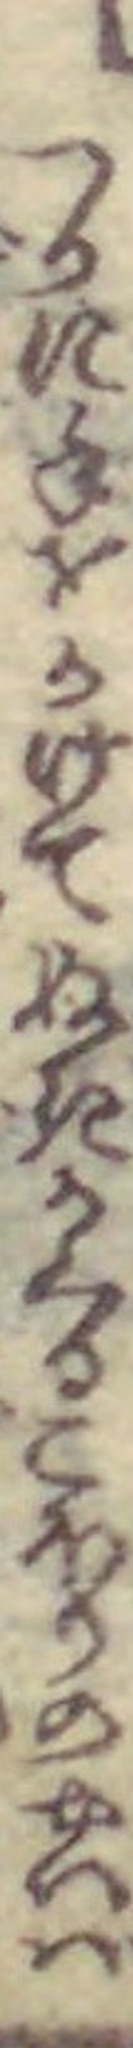つかに手をかけてぬきかくるこほりのやいば
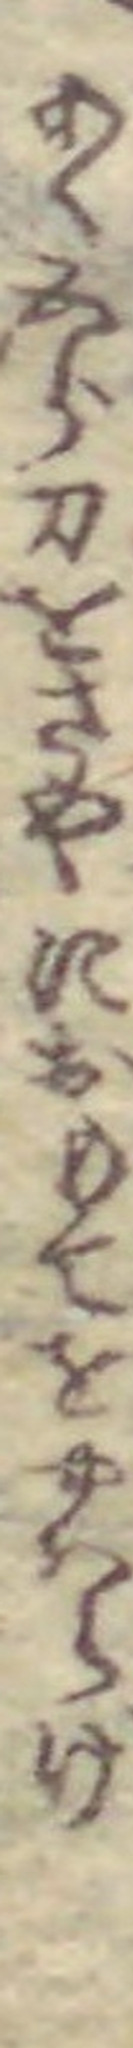あく五郎刀をさやにおもてをやはらげ
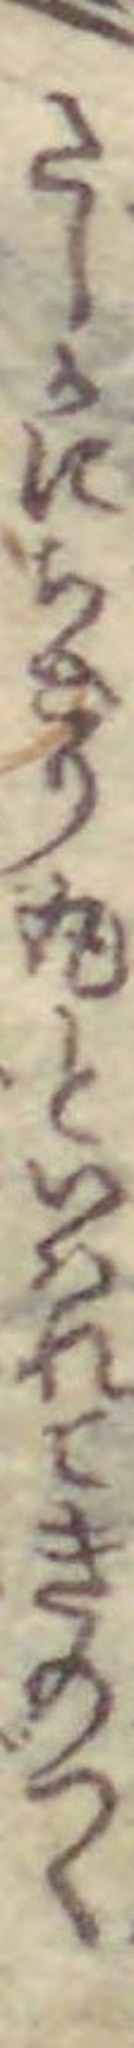たしかにちどり丸といはれてきのつく
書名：八ツ目鱣因縁物語 3巻
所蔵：国立国会図書館 National Diet Library, JAPAN
